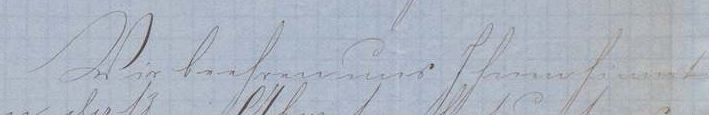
Wir beehren uns Ihnen hiemit
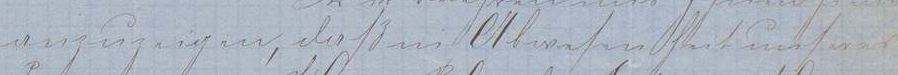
anzuzeigen, daß in Abwesenheit unseres
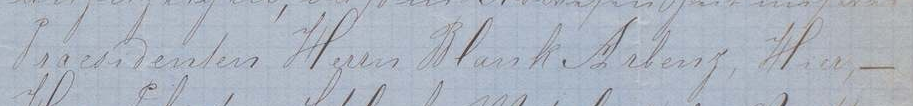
Praesidenten Herrn Blank Arbenz, Hier, –
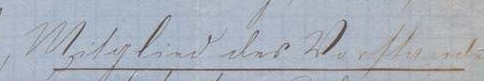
Mitglied des Vorstandes,
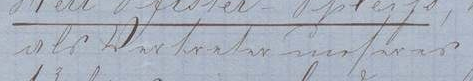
als Vertreter unseres
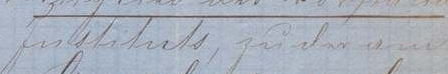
Instituts, zu der am
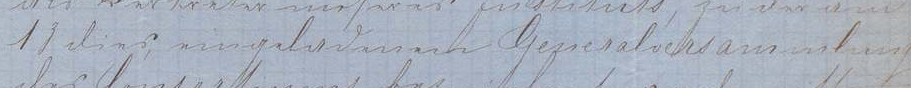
13 dies, eingeladenen Generalversammlung
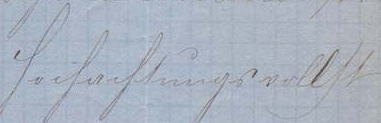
Hochachtungsvollst
